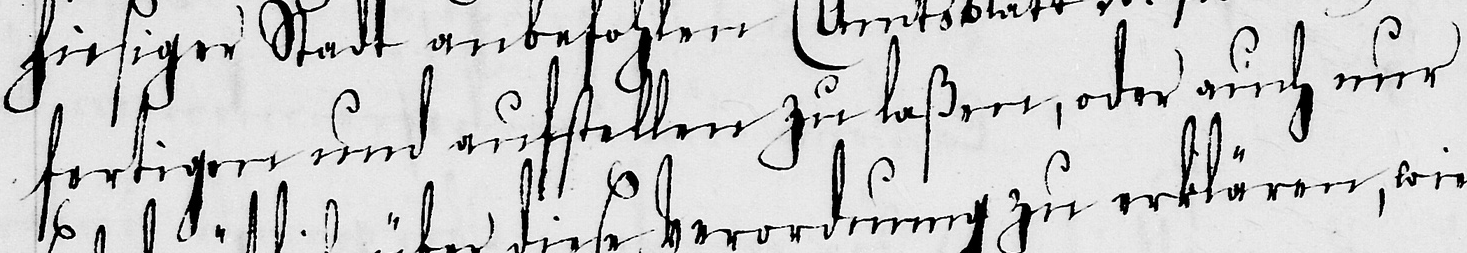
fertigen und aufstellen zu laßen, oder auch nur
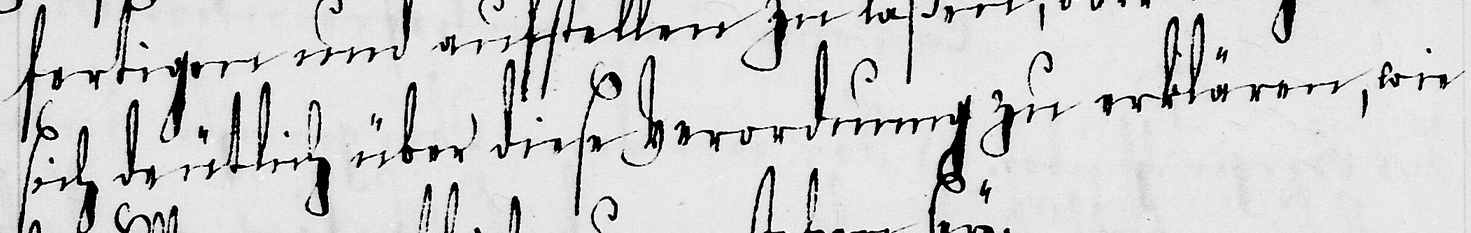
sich deutlich über diese Verordnung zu erklären, wie
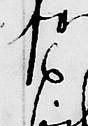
t.
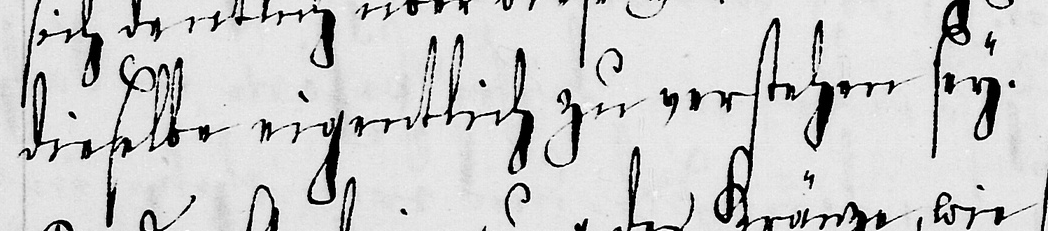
dieselbe eigentlich zu verstehen sey.
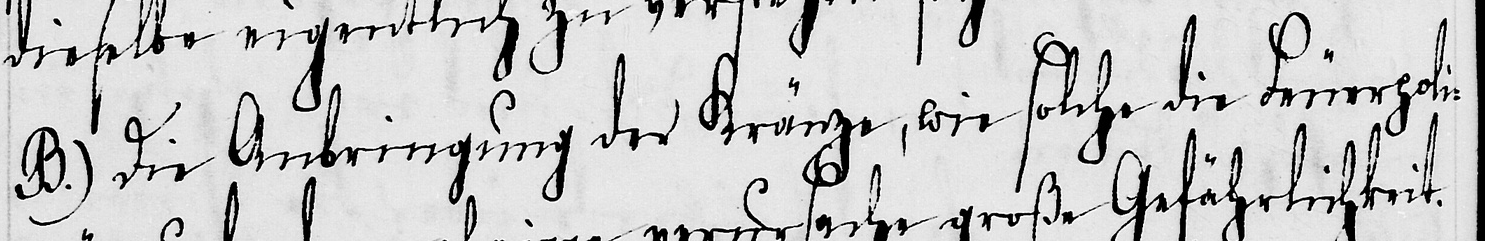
B.) Die Anbringung der Kränze, wie solche die Feuerpoli¬
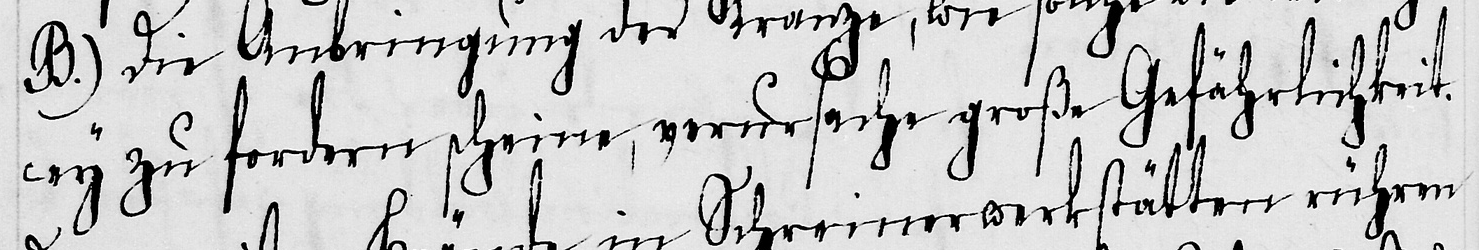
cey zu fordern scheine, verusache große Gefährlichkei¬
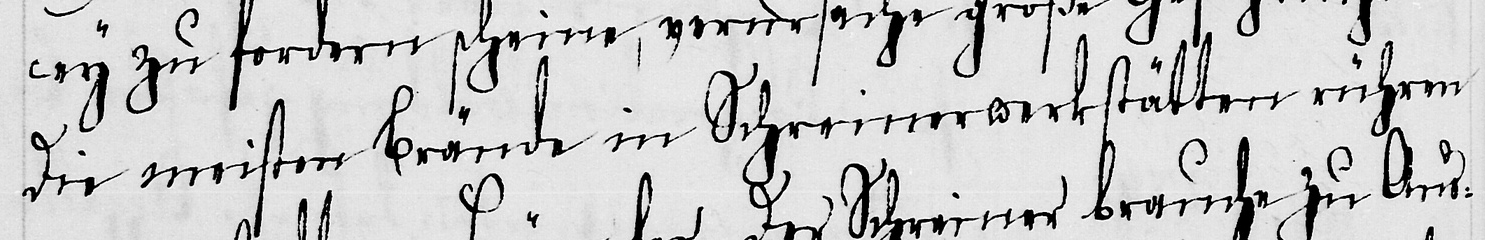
Die meisten Brände in Schreinerwerkstätten rühren
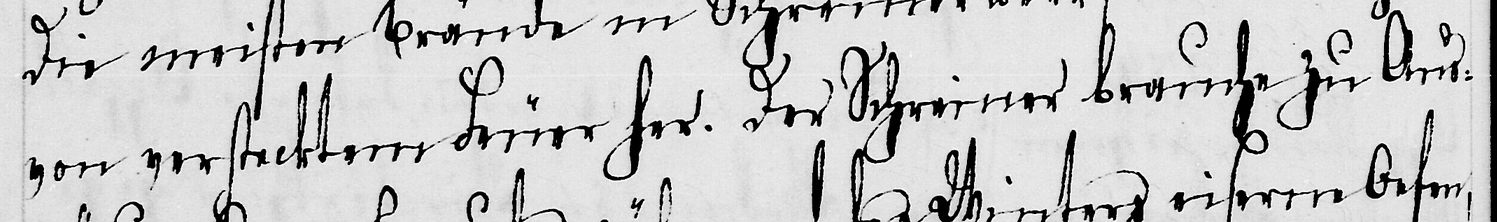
von verstecktem Feuer her. Der Schreiner brauche zu Aus¬
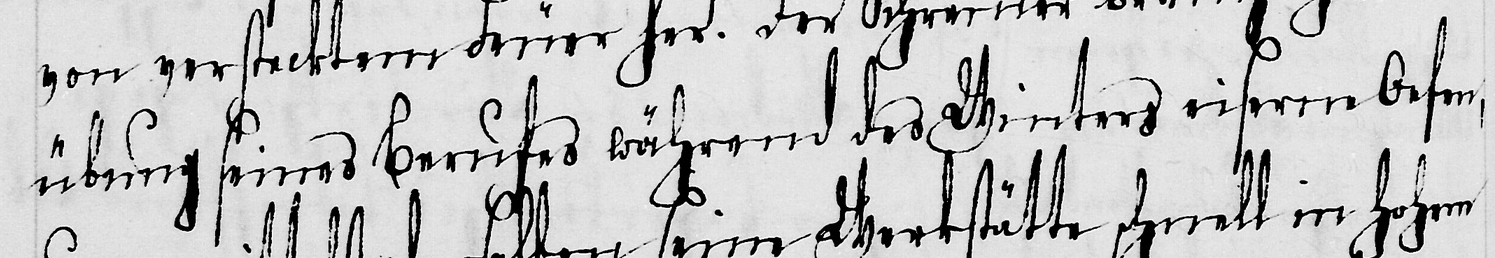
übung seines Berufes während des Winters eiserne Oefen,
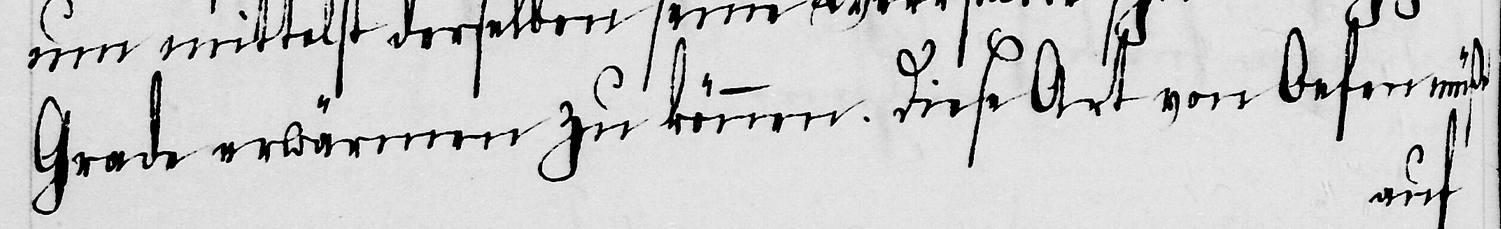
Grade erwärmen zu können. Diese Art von Oefen
